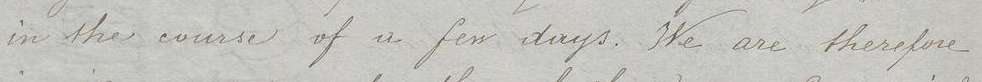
in the course of a few days. We are therefore
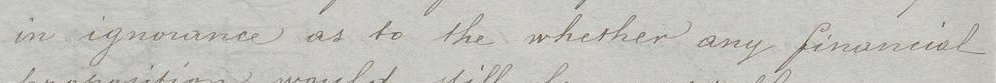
in ignorance as to the whether any financial
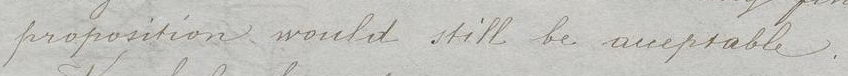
proposition would still be acceptable.
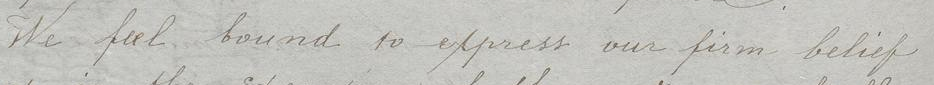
We feel bound to express our firm belief
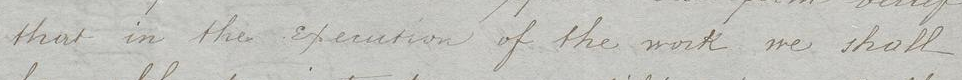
that in the execution of the work we shall
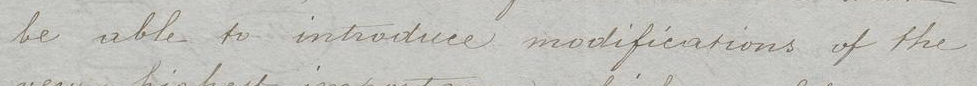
be able to introduce modifications of the
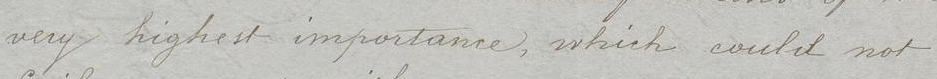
very highest importance, which could not
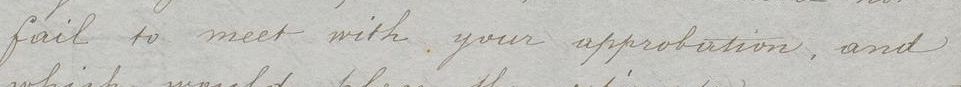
fail to meet with your approbation, and
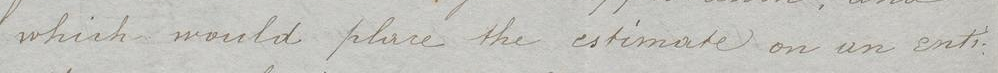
which would place the estimate on an enti-
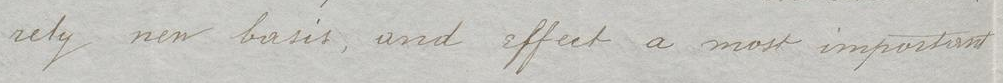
rely new basis, and effect a most important
